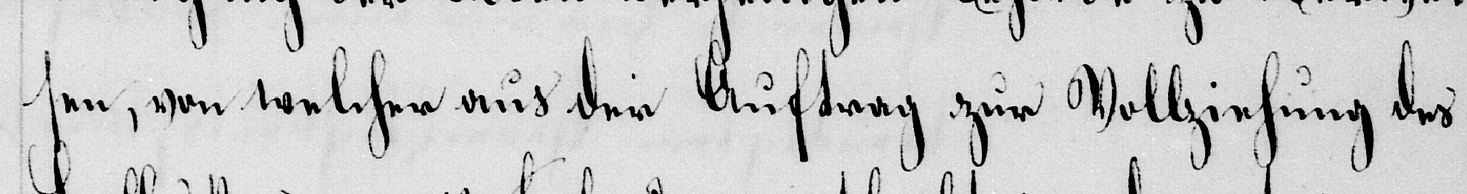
sen, von welcher aus der Auftrag zur Vollziehung des
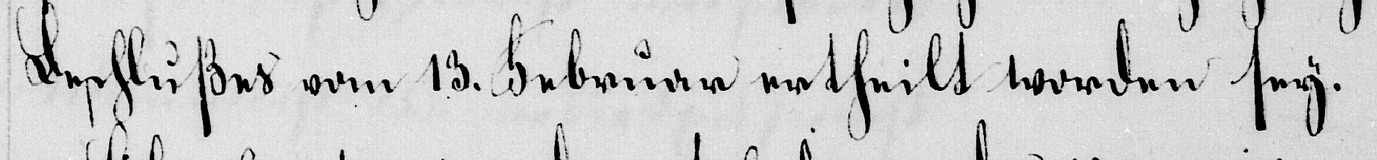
Beschlußes vom 13. Februar ertheilt worden sey.
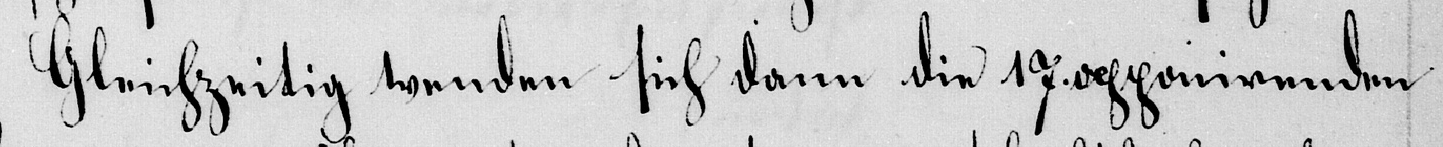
Gleichzeitig wenden sich dann die 17. opponirenden
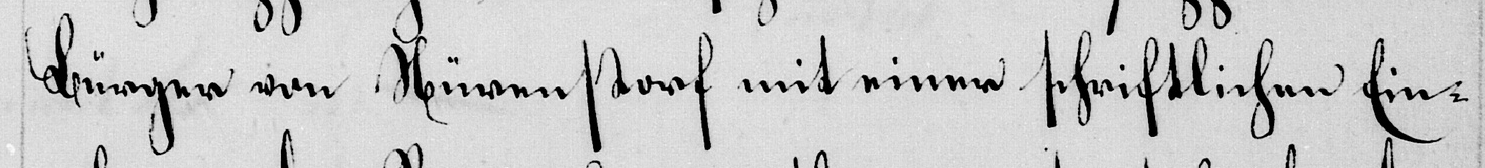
Bürger von Nürenstorf mit einer schriftlichen Ein¬
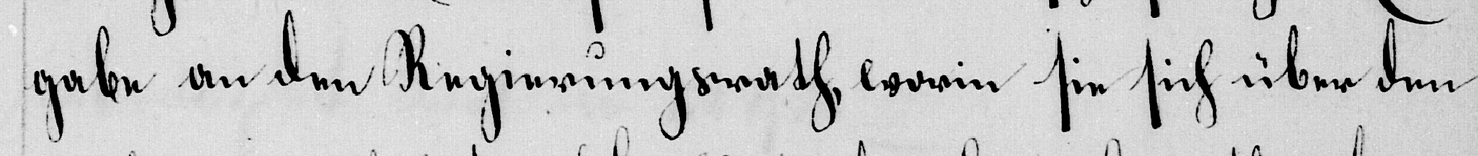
gabe an den Regierungsrath, worin sie sich über den
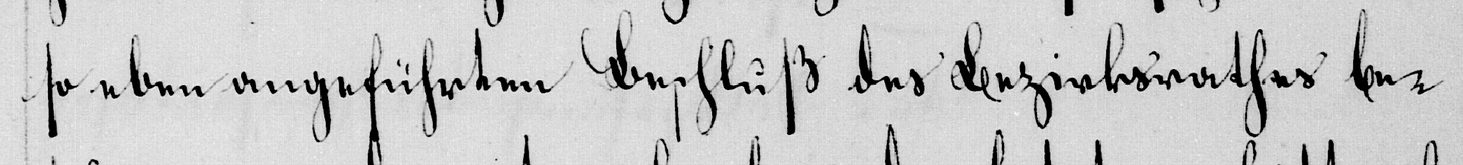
so eben angeführten Beschluß des Bezirksrathes be¬
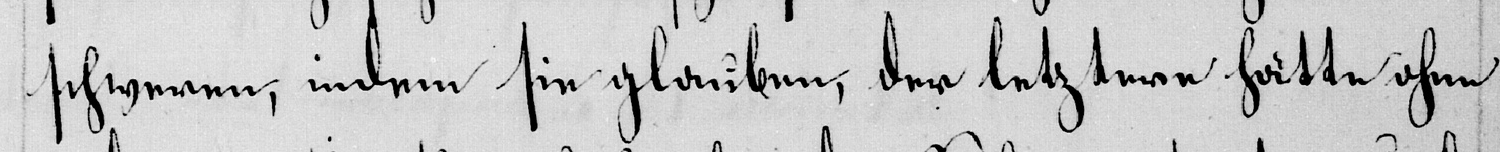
schweren, indem sie glauben, der letztere hätte ohne
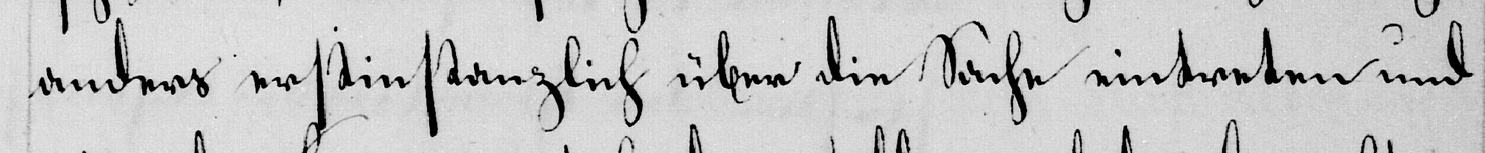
anders erstinstanzlich über die Sache eintreten und
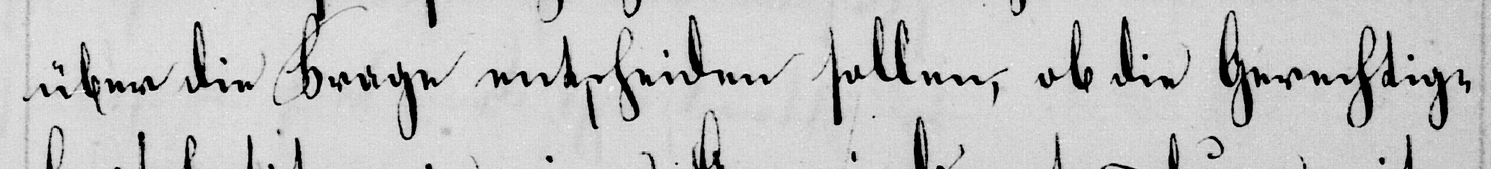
über die Frage entscheiden sollen, ob die Gerechtig¬
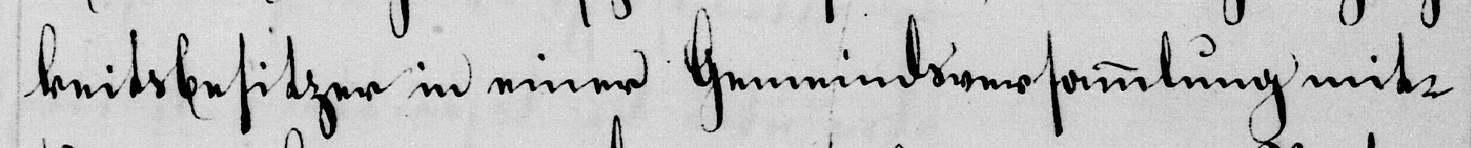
keitsbesitzer in einer Gemeindsversammlung mit¬
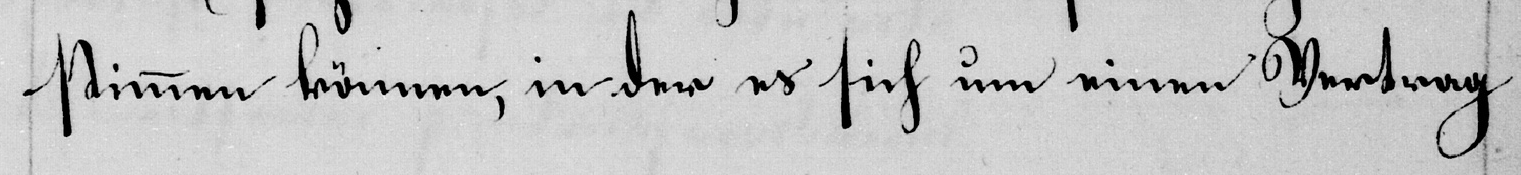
stimmen können, in der es sich um einen Vertrag
